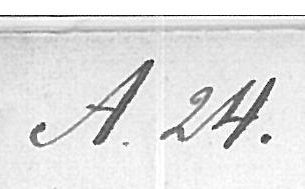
A. 24.
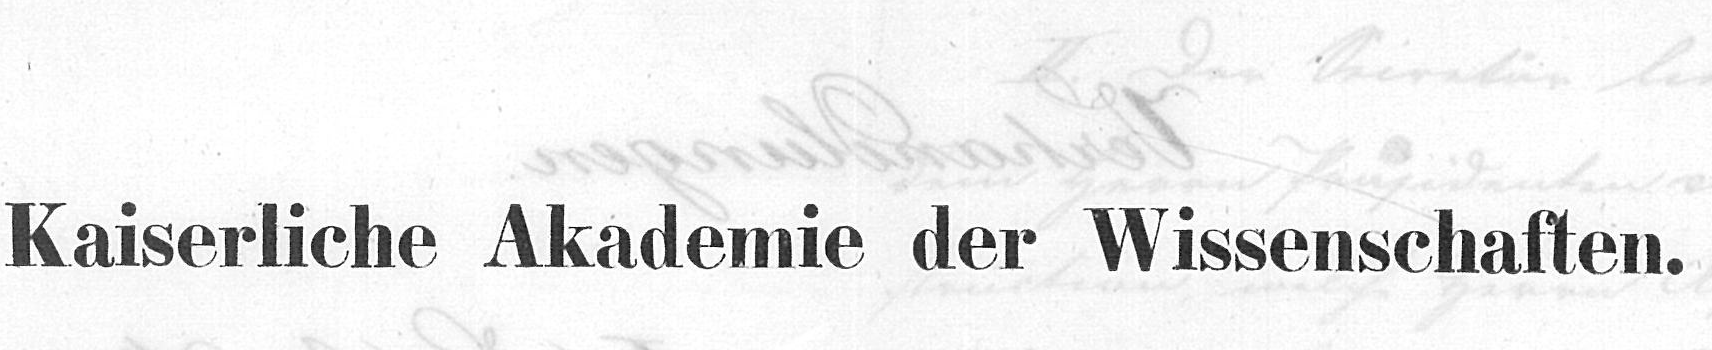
Kaiserliche Akademie der Wissenschaften.
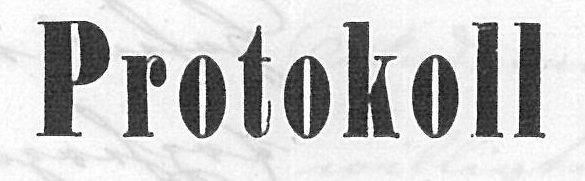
Protokoll
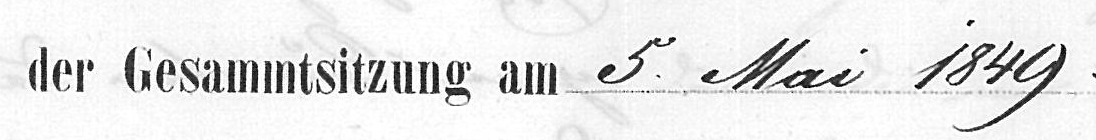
der Gesammtsitzung am 5. Mai 1849.
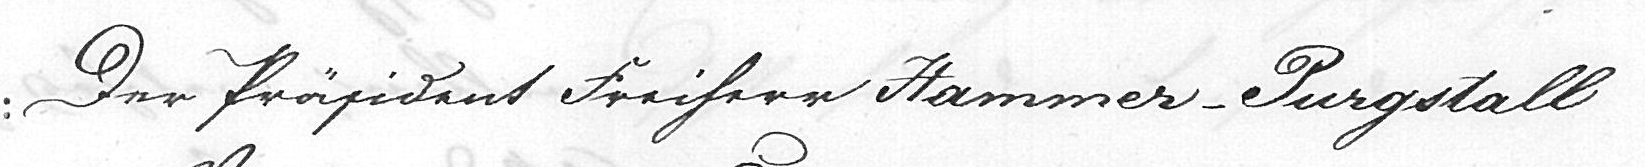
Der Präsident Freiherr Hammer-Purgstall
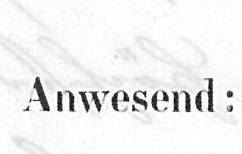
Anwesend:
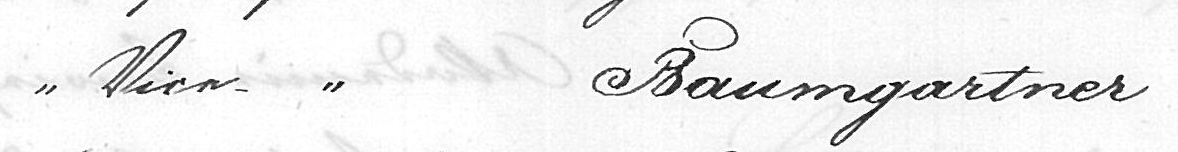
" Vice- " Baumgartner
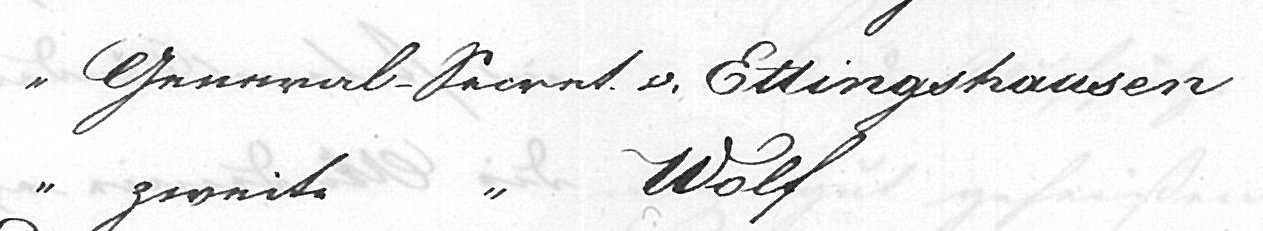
" General-Secret. v. Ettingshausen
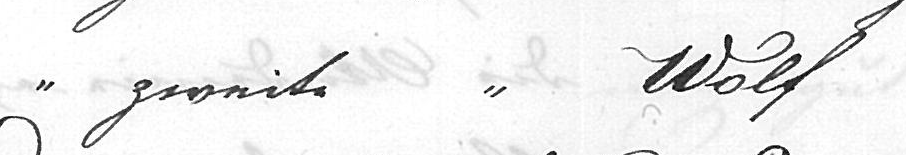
" zweite " Wolf
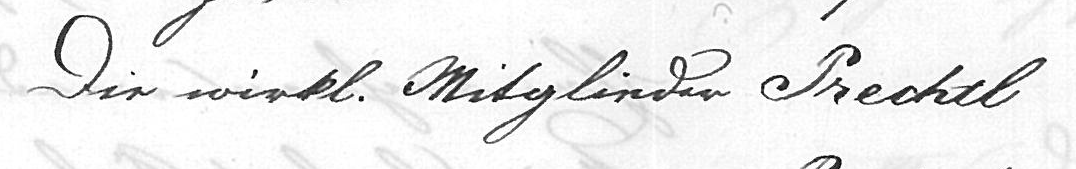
Die wirkl. Mitglieder Prechtl
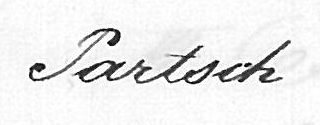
Partsch
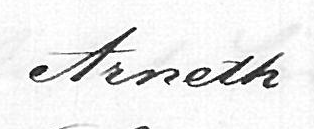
Arneth
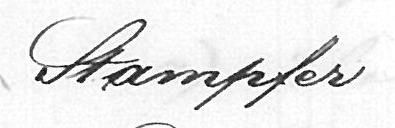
Stampfer
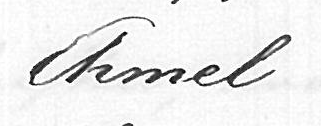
Chmel
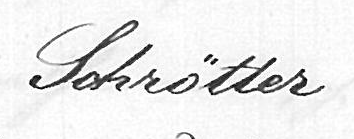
Schrötter
